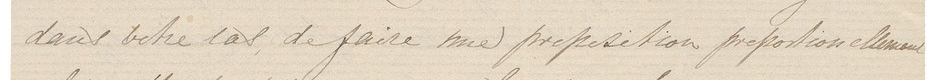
dans votre cas, de faire une proposition proportionellement
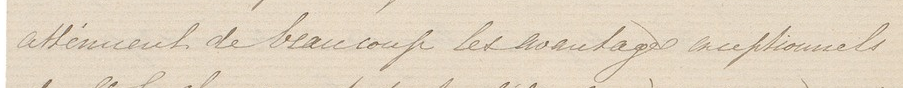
atténuent de beaucoup les avantages exceptionnels
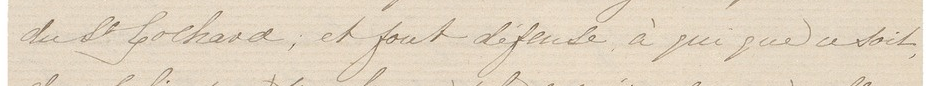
du St Gothard; et font défense, à qui que ce soit,
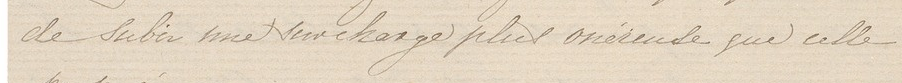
de subir une surcharge plus onéreuse que celle
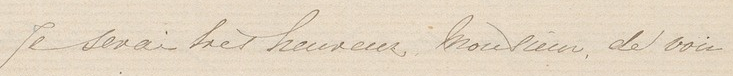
Je serai très heureux, Monsieur, de voir
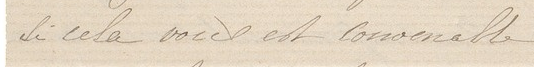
si cela vous est convenable.
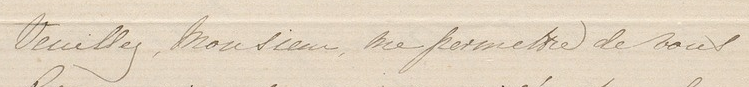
Veuillez, Monsieur, me permettre de vous
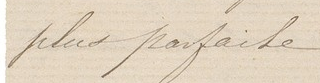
plus parfaite.
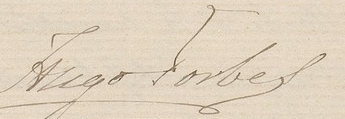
Hugo Forbes
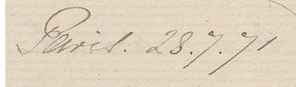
Paris. 28.7.71
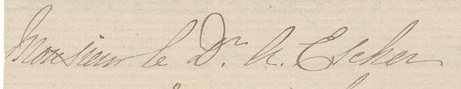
Monsieur le Dr A. Escher
